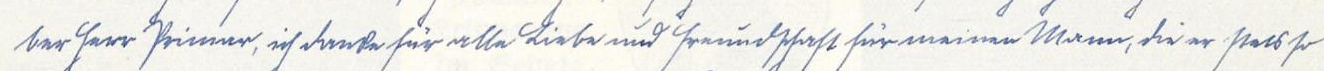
ber Herr Primar, ich danke für alle Liebe und Freundschaft für meinen Mann, die er selbst so
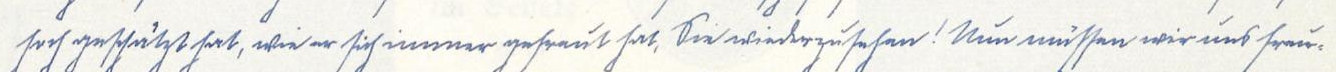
hoch geschätzt hat, wie er sich immer gefreut hat, Sie wiederzusehen! Nun müssen wir uns freu-
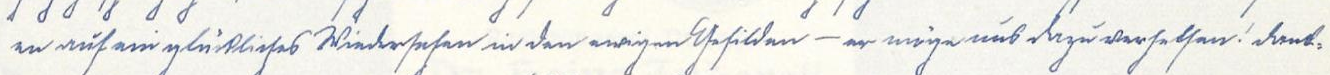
en auf ein glückliches Wiedersehen in den ewigen Gefilden- er möge uns dazu verhelfen! Dank-
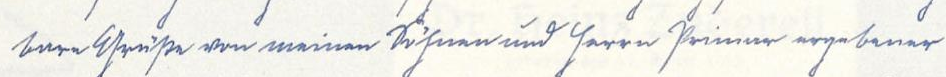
bare Grüße von meinem Sohne und Herren Primar ergebener
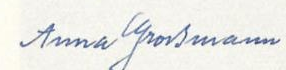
Anna Großmann
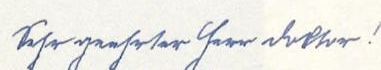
Sehr geehrter Herr Doktor!
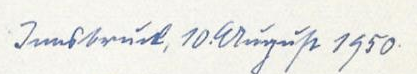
Innsbruck, 10. August 1950.
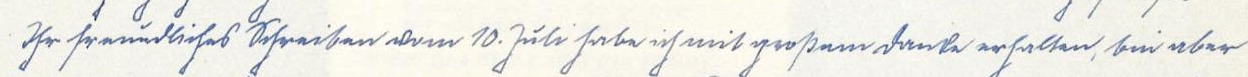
Ihr freundliches Schreiben vom 10. Juli habe ich mit großem Danke erhalten, bin aber
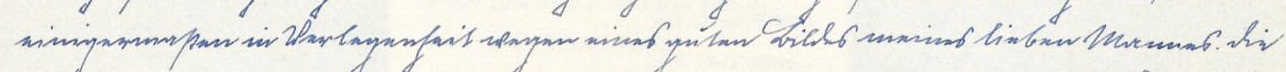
einigermaßen in Verlegenheit wegen eines guten Bildes meines lieben Mannes. Die
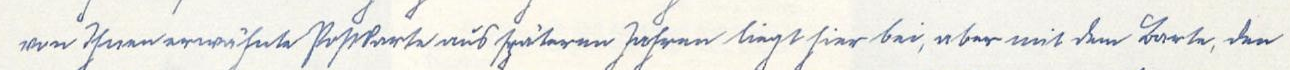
von ihnen erwünschte Postkarte aus späteren Jahren liegt hier bei, aber mit dem Barte, den
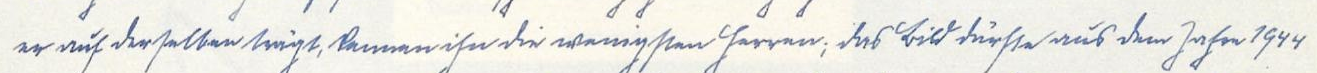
er auf derselben trägt, kennen ihn die wenigsten Herren; Das Bild dürfte aus dem Jahre 1944
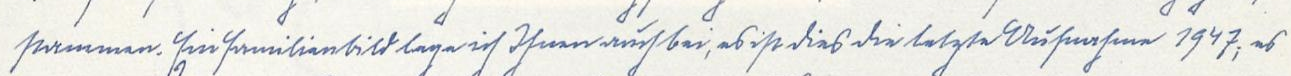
stammen. Ein Familienbild lege ich Ihnen auch bei, es ist dies die letzte Aufnahme 1947; es sind
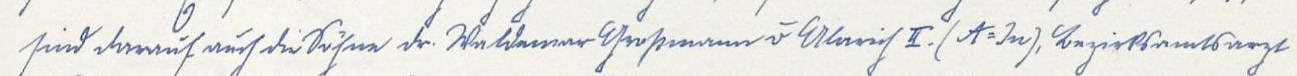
darauf auch die Söhne Dr. Waldemar Großmann v/o Alarich II ( A-In), Bezirksamtsarzt
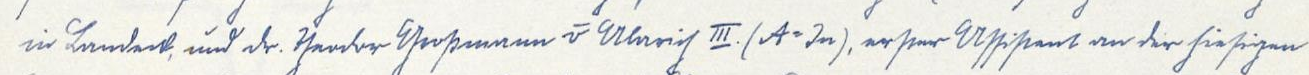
in Landeck, und Dr. Theodor Großmann v/o Alarich III (A-In), erster Assistent an der hiesigen
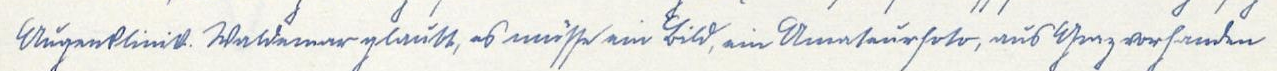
Augenklinik. Waldemar glaubt, es müsse ein Bild, ein Amateurfoto, aus Graz vorhanden
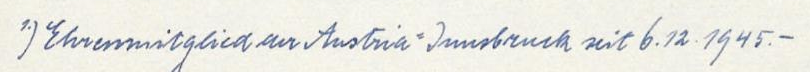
1) Ehrenmitglied der Austria-Innsbruck seit 6.12.1945.
